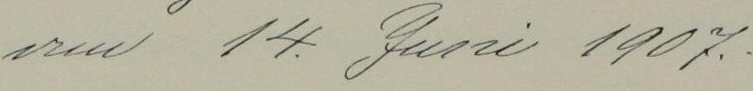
am 14. Juni 1907.
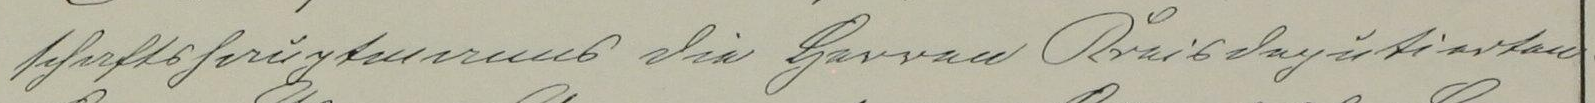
schaftshauptmanns die Herren Kreisdeputierten:
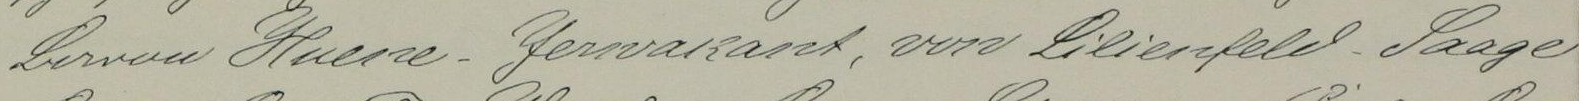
Baron Huene-Jerwakant, von Lilienfeld-Saage,
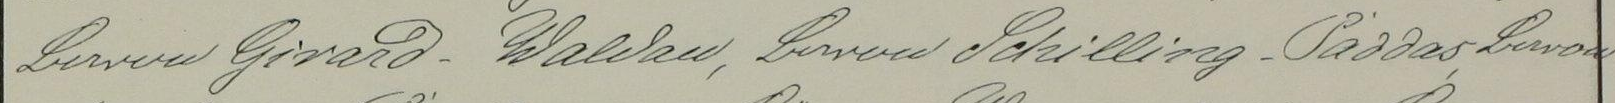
Baron Girard-Waldau, Baron Schilling-Paddas, Baron
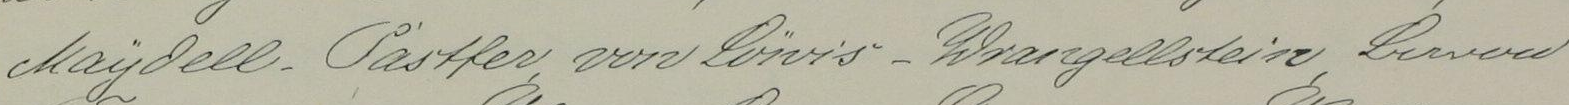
Maydell-Pastfer, von Löwis-Wrangelstein, Baron
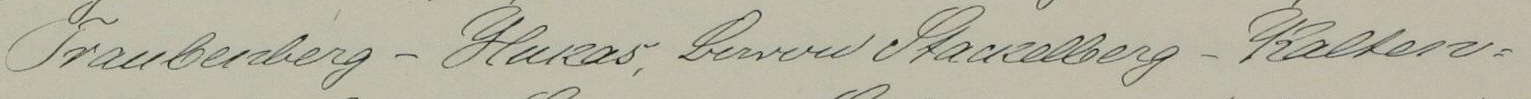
Traubenberg-Hukas, Baron Stackelberg-Kalten-
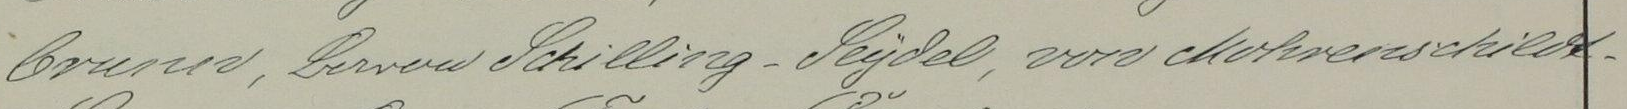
brunn, Baron Schilling-Seydel, von Mohrenschildt-
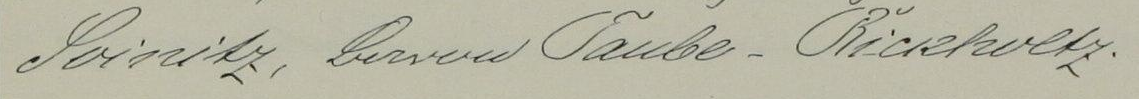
Soinitz, Baron Taube-Rickholtz.
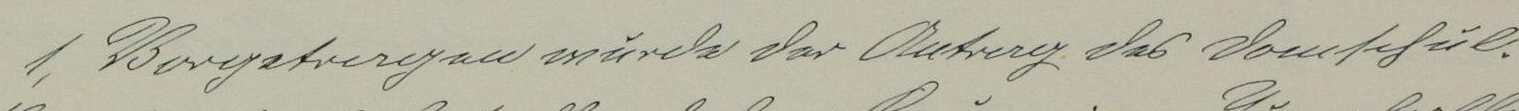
1. Vorgetragen wurde der Antrag des Domschul-
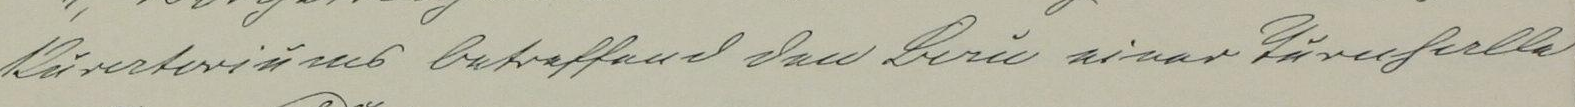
kuratoriums betreffend den Bau einer Turnhalle
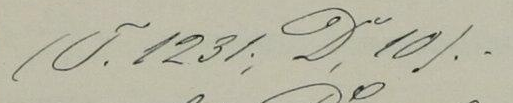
(T.1231; D.10).
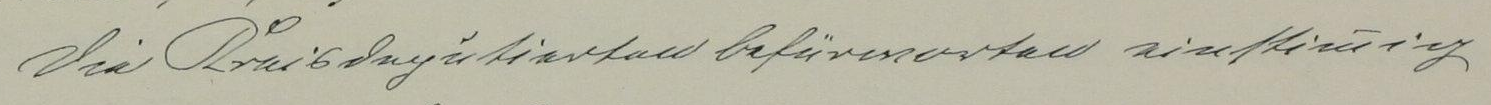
Die Kreisdeputierten befürworten einstimmig
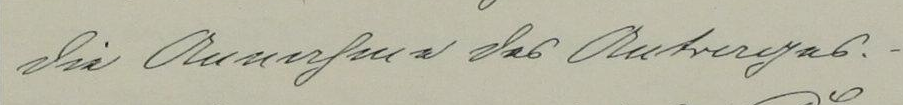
die Annahme des Antrages.
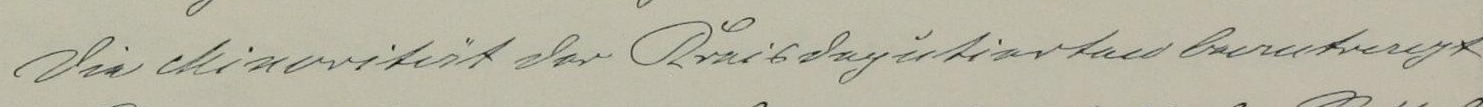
Die Minorität der Kreisdeputierten beantragt
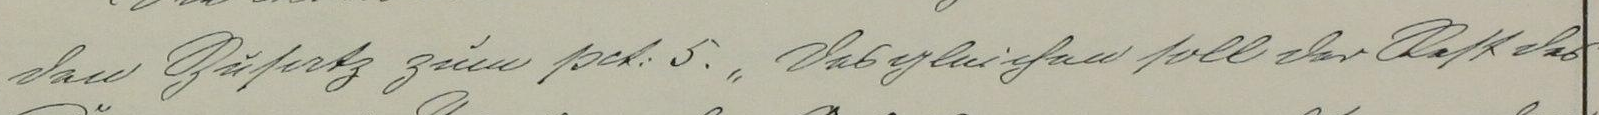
den Zusatz zum pct. 5. „Desgleichen soll der Rest des
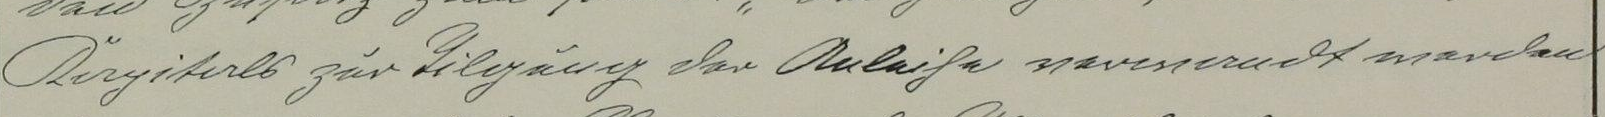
Kapitals zur Tilgung der Anleihe verwandt werden
